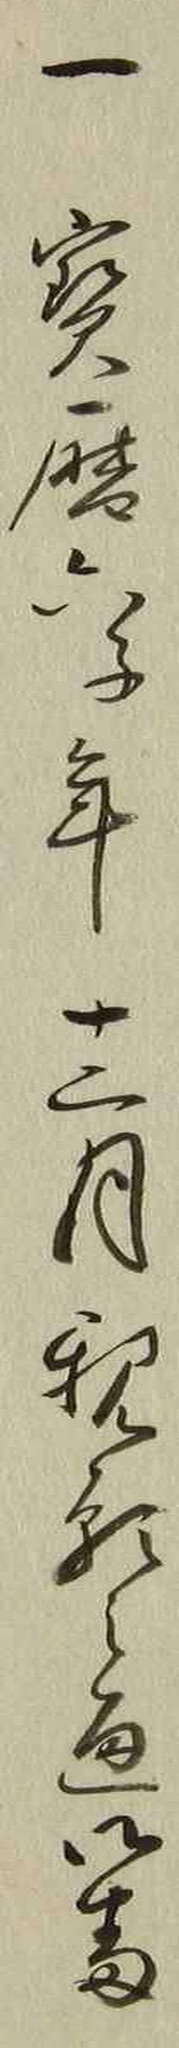一宝暦六子年十二月親願之通御番
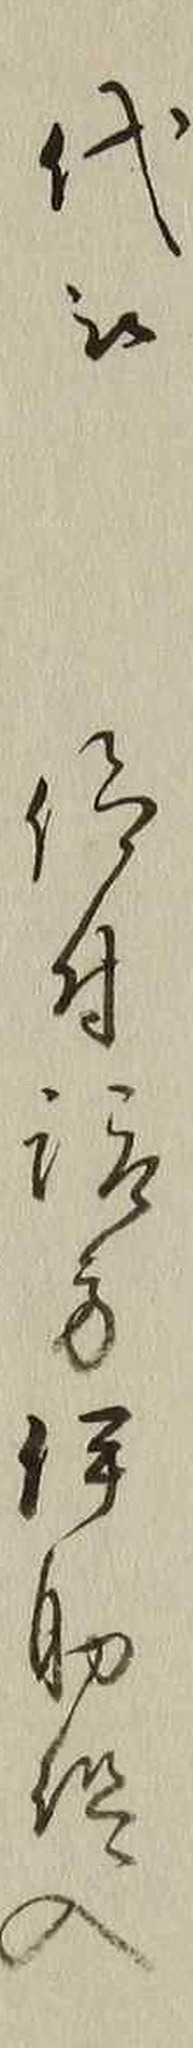代被仰付諏方伊助組へ入
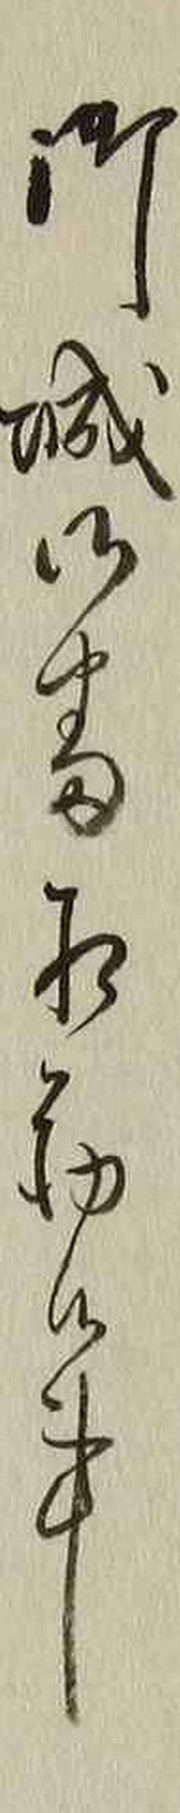御城御番相勤候事
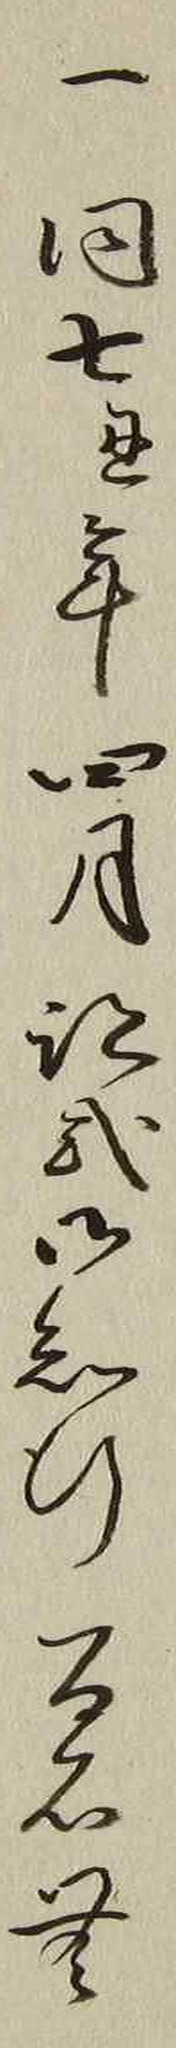一同七丑年四月跡式御知行百石無
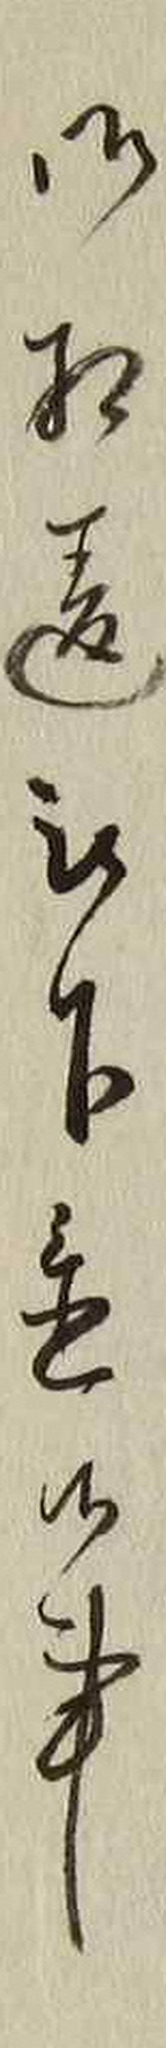御相違被下置候事
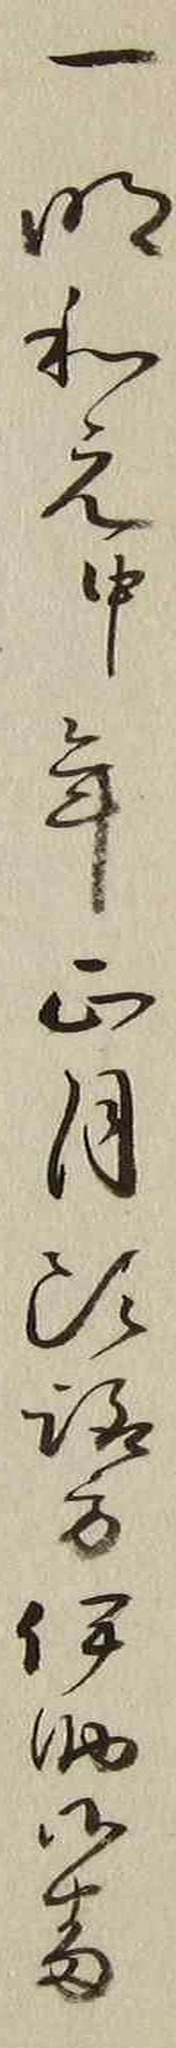一明和元申年正月頭諏方伊助御番
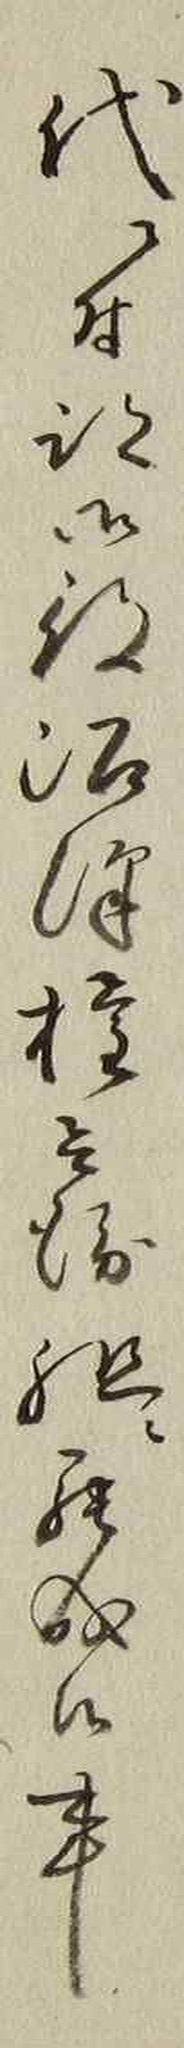代ニ付跡御役沼津権兵衛組ニ罷成候事
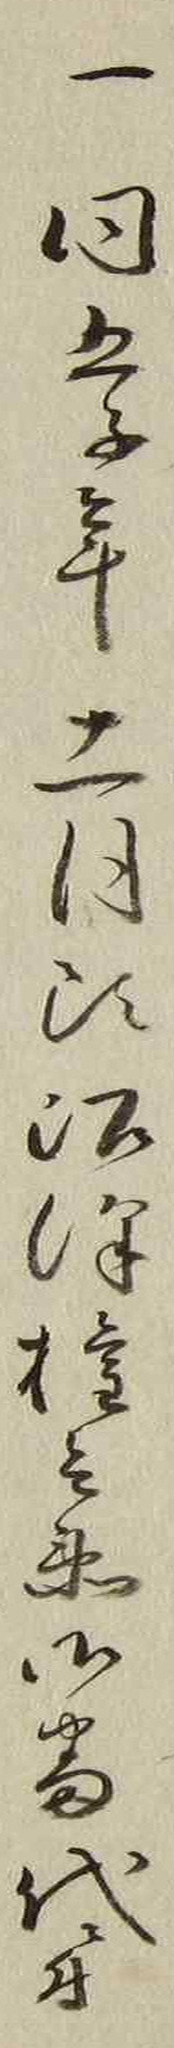一同五子年十一月頭沼津権兵衛御番代ニ付
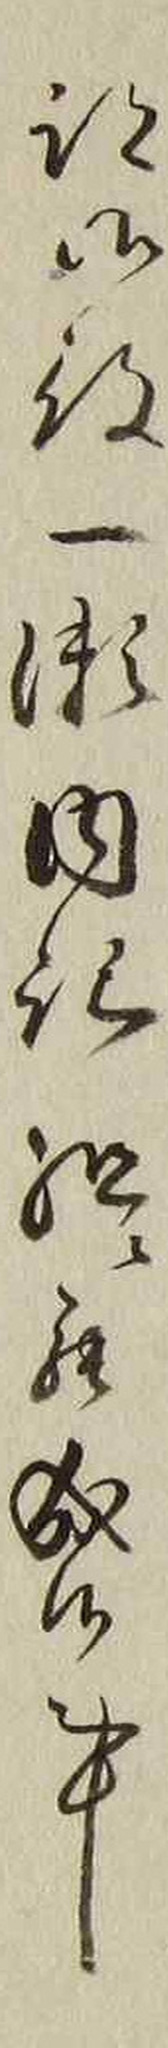跡御役一瀬内記組ニ罷成候事
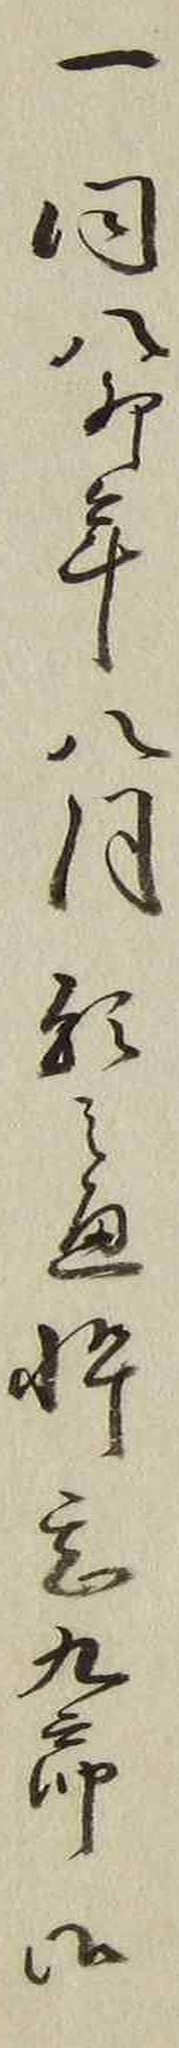一同八卯年八月願之通忰甚九郎御
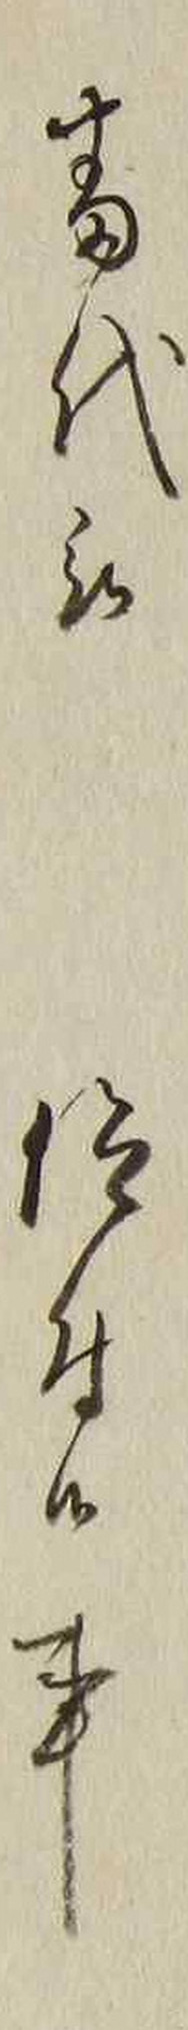番代被仰付候事

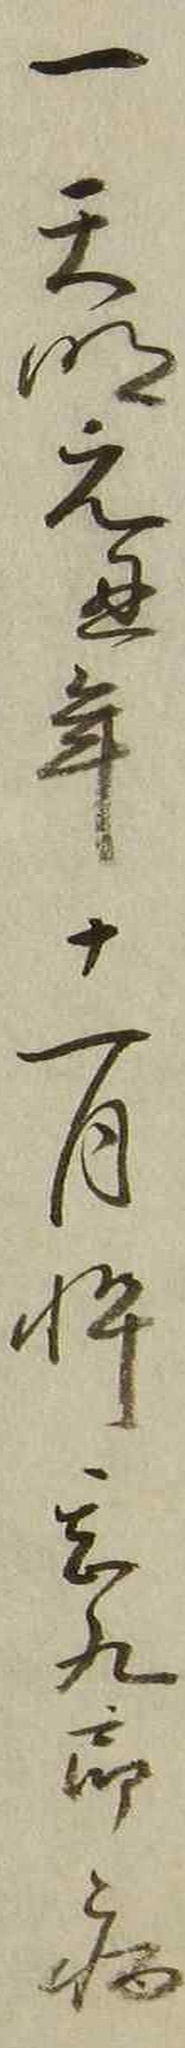一天明元丑年十一月忰甚九郎病
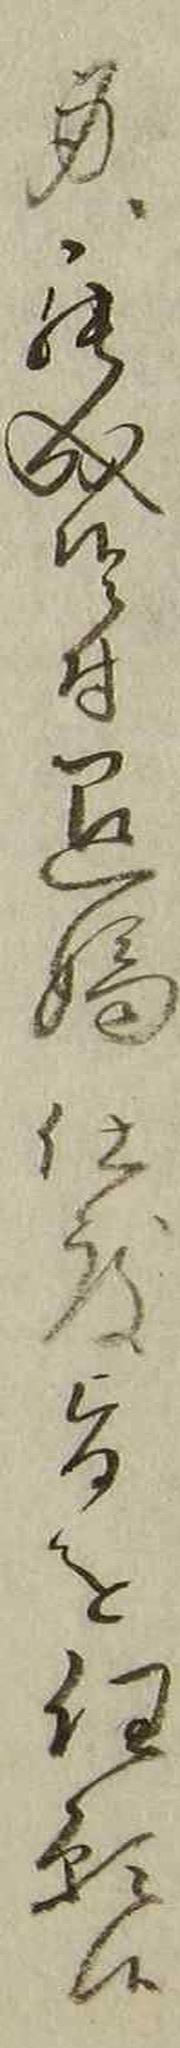身ニ罷成候ニ付退嫡仕度旨を任願候
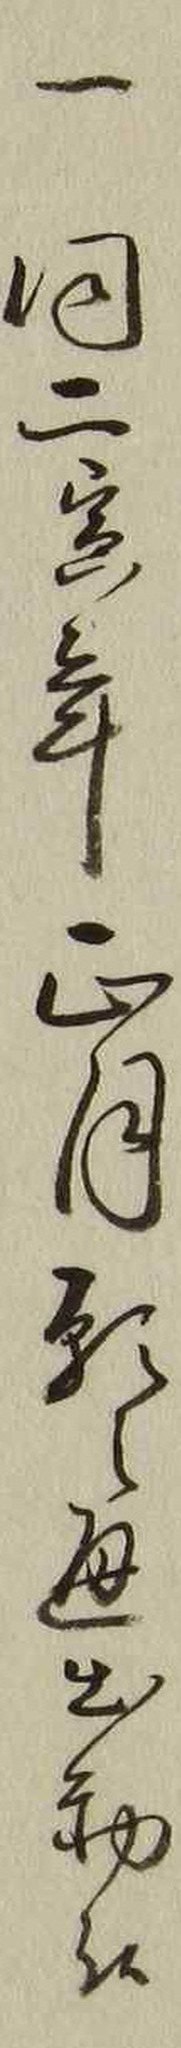一同二寅年正月願之通出勤被
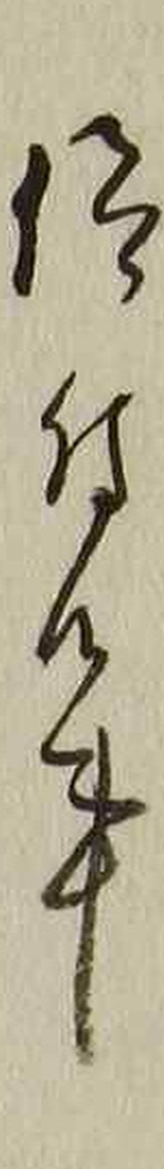仰付候事
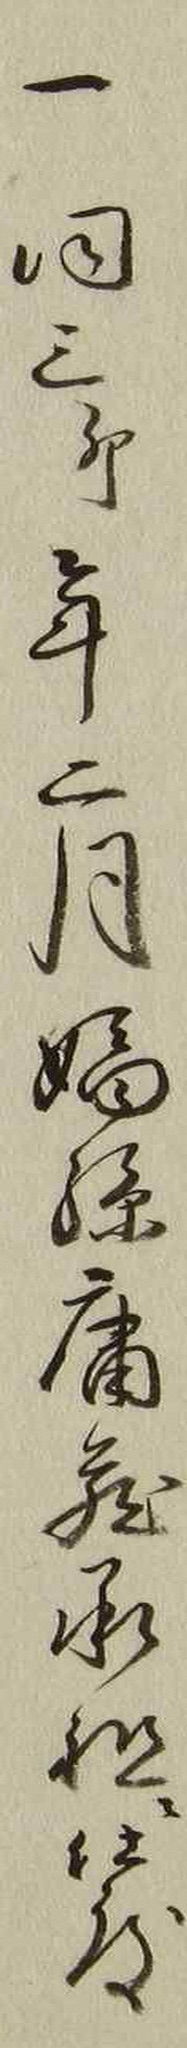一同三卯年二月嫡孫庸蔵承組ニ仕度
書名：諸士系譜　巻之4　い之部4
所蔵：会津若松市立会津図書館
